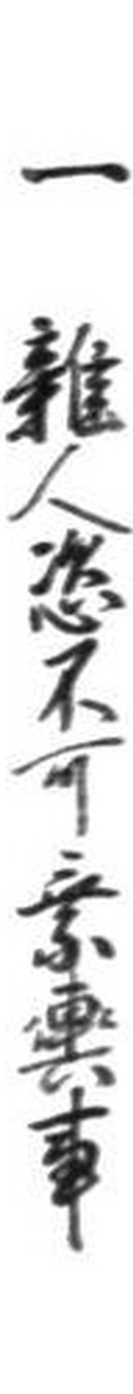一雑人恣不可乗輿事
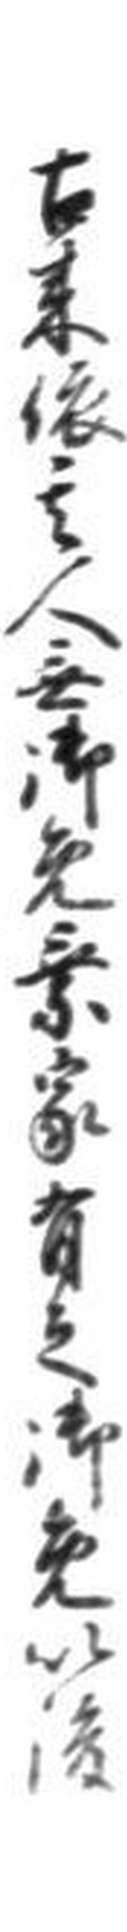古来依其人無御免乗家有之御免以後
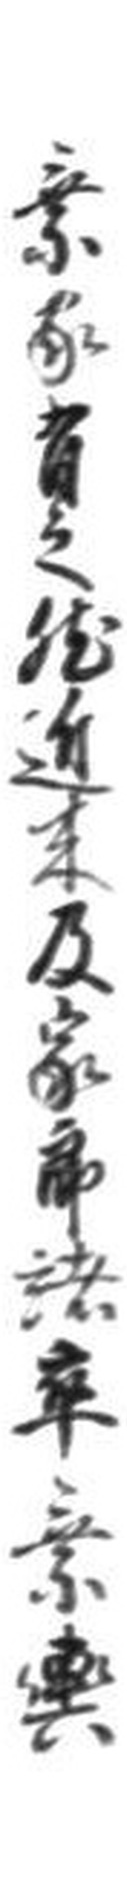乗家有之然近来及家郎諸卒乗輿

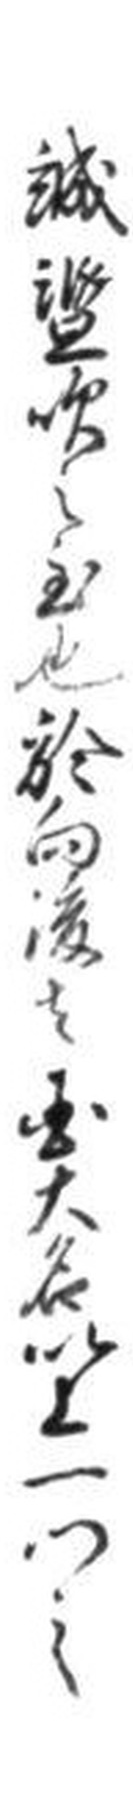誠濫吹之至也於向後者国大名以上一門之
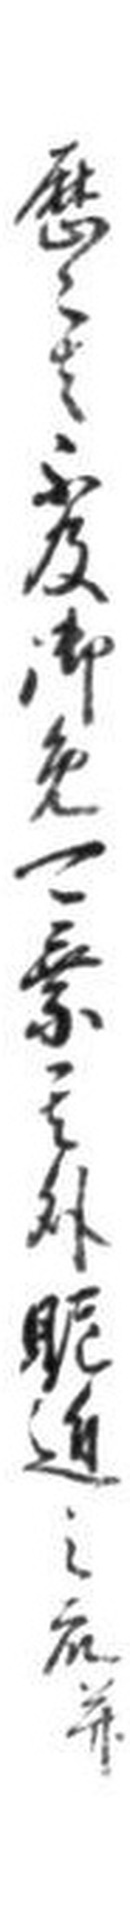歴々者不及御免可乗其外昵近之衆并
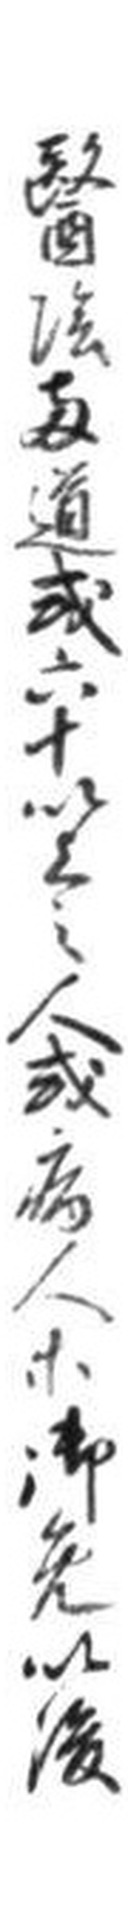医陰両道或六十以上之人或病人等御免以後
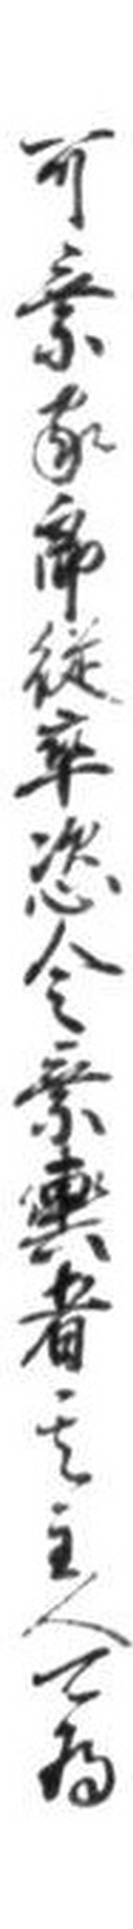可乗家郎従卒恣令乗輿者其主人可為
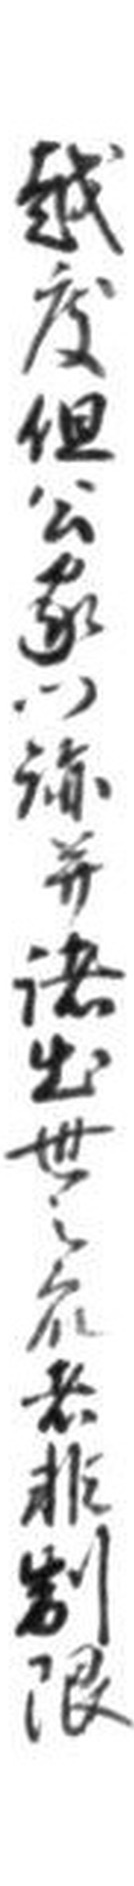越度但公家門跡并諸出世之衆者非制限
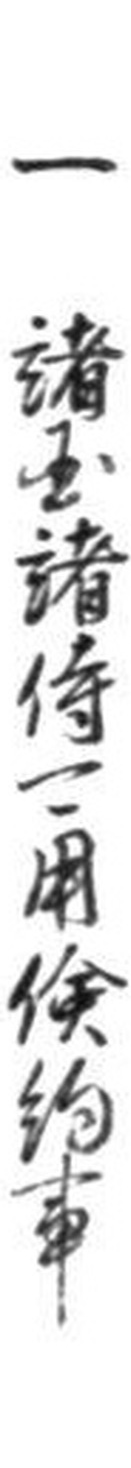一諸国諸侍可用倹約事
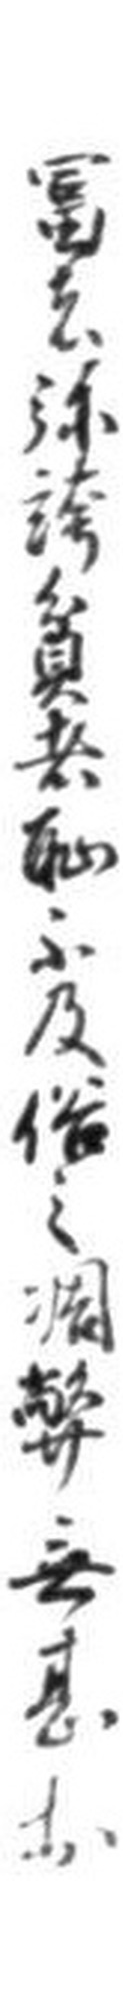富者弥誇貧者恥不及俗之凋弊無甚於
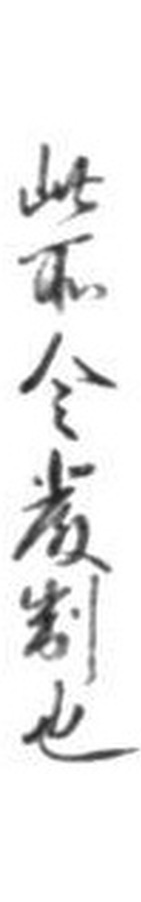此所令厳制也
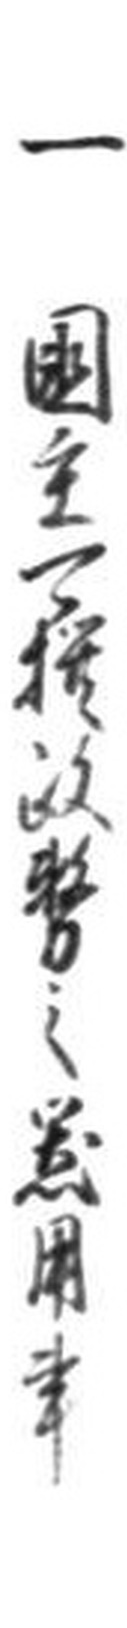一国主可撰政務之器用事
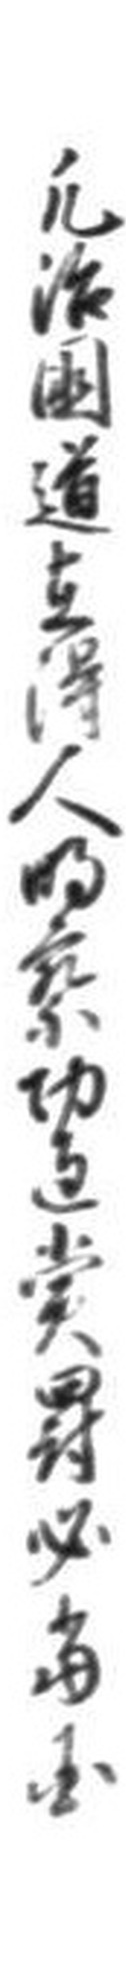凡治国道在得人明察功過賞罰必当国
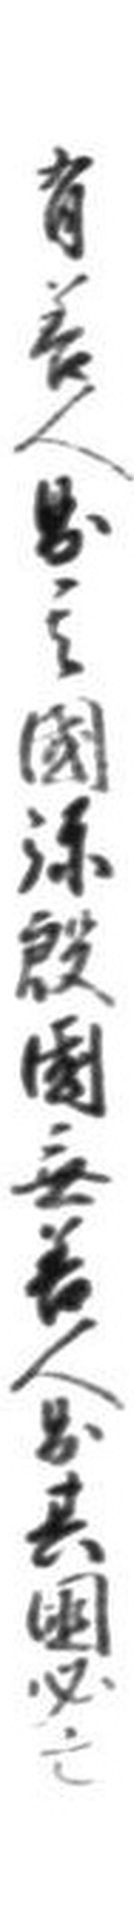有善人則其国弥殷国無善人則其国必亡
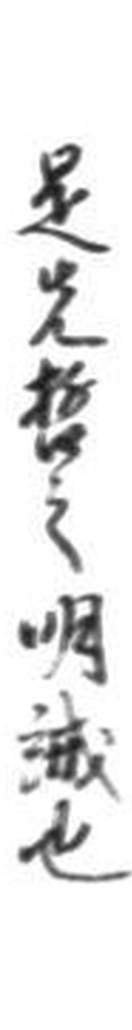是先哲之明誠也
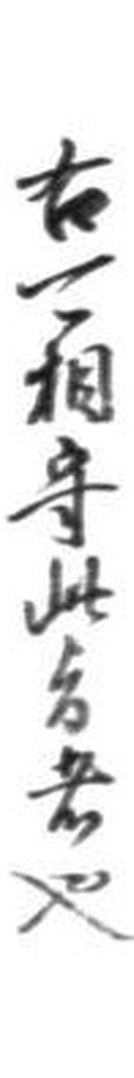右可相守此旨者也
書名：家譜 二 忠直公 従文禄四年到慶安四年
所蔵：福井県文書館 Fukui Prefectural Archives
